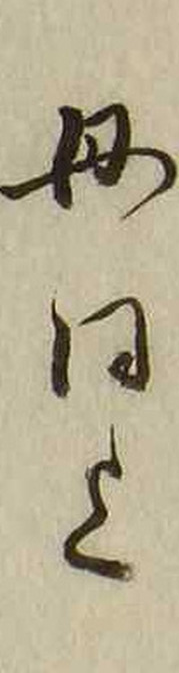母同上
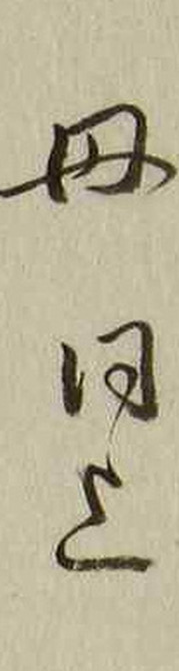母同上
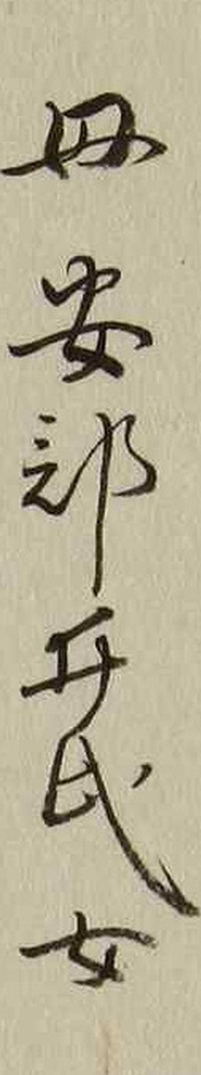母安部井氏女
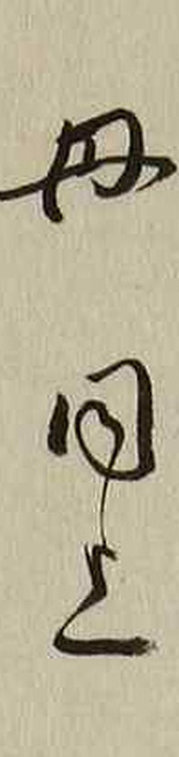母同上
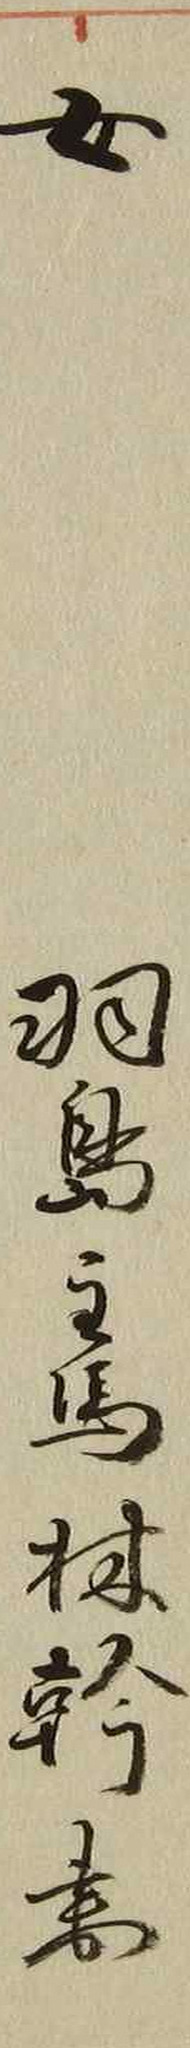女羽島主馬林幹妻
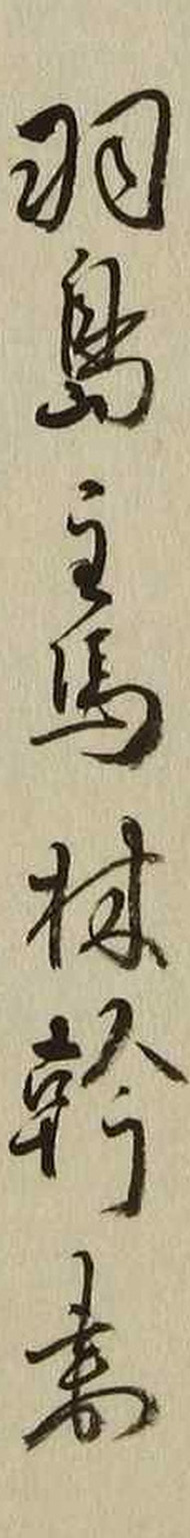女羽島主馬林幹妻
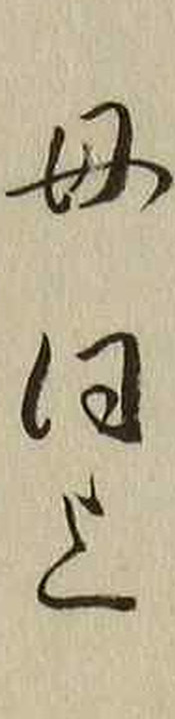母同上
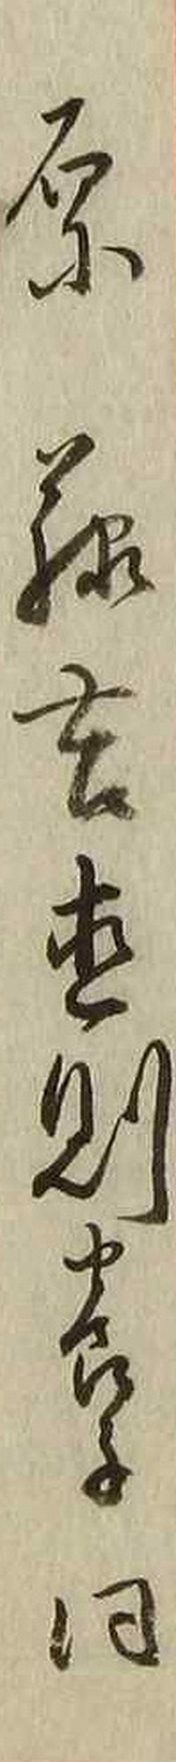原藤玄直則養子同
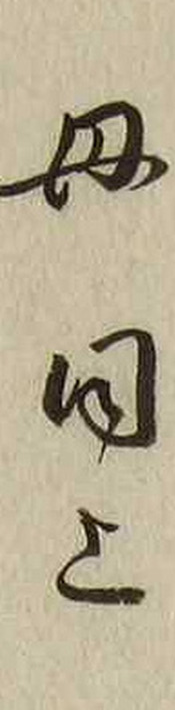母同上
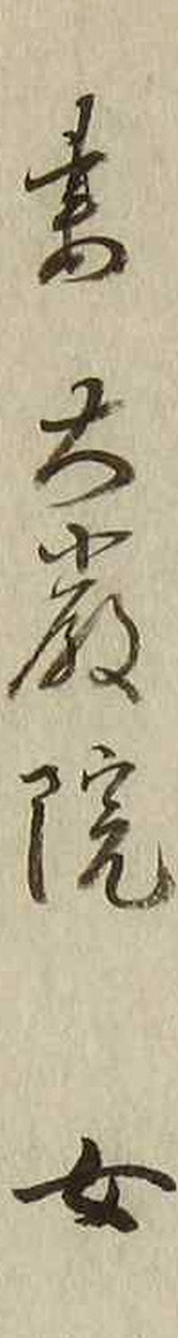妻大厳院女

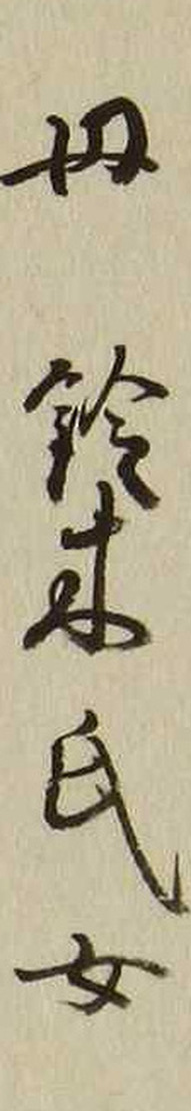母鈴木氏女
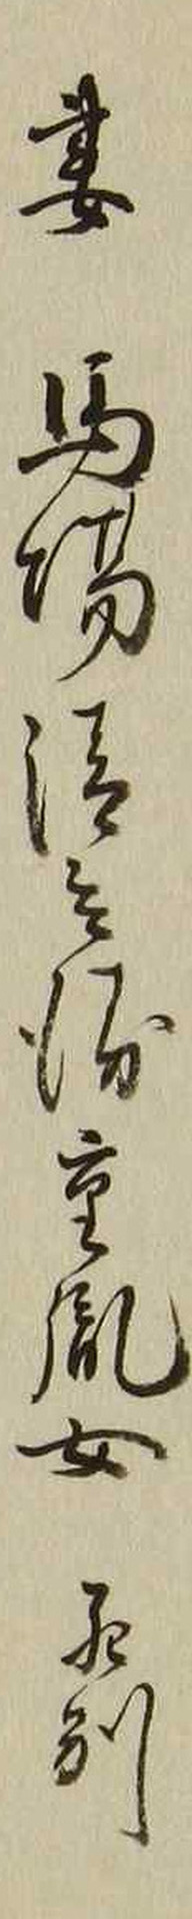妻馬場清兵衛重胤女死別
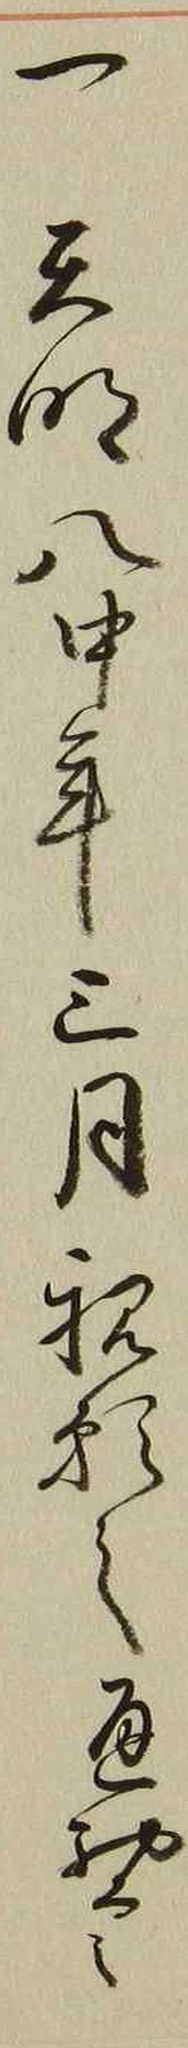一天明八申年三月親願之通初而之
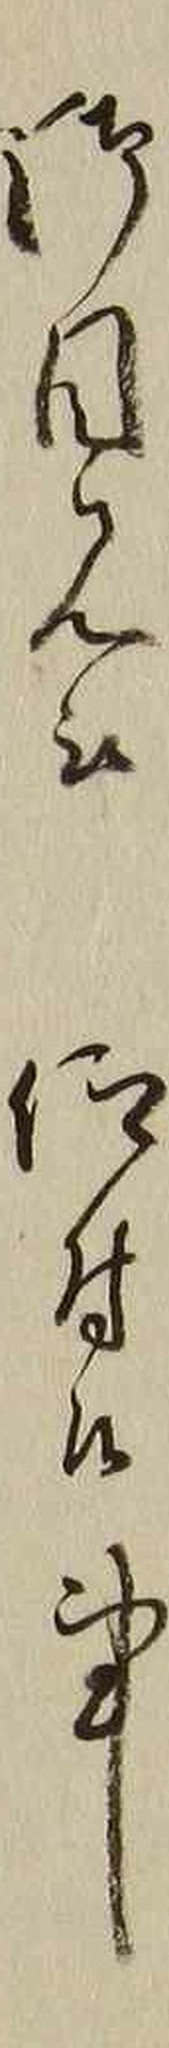御目見被仰付候事
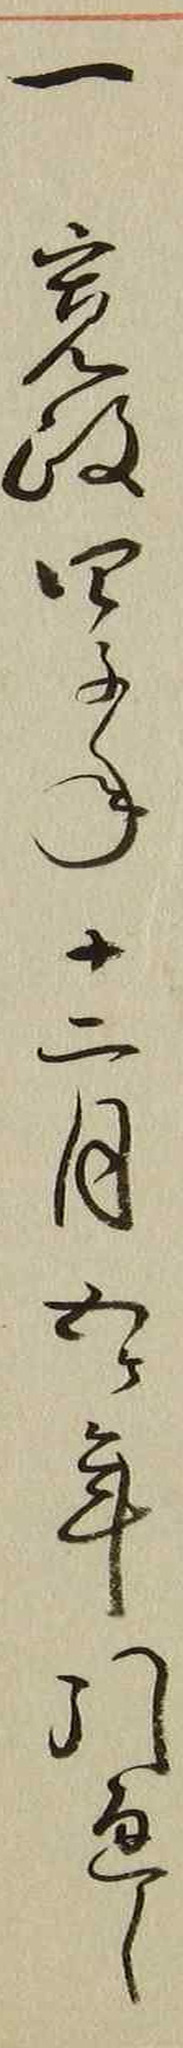一寛政四子年十二月五ヶ年引通之
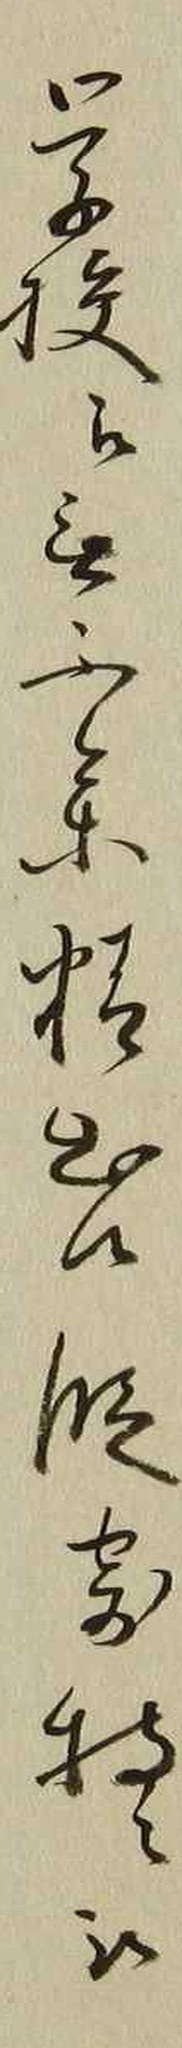学校江無不参精出候段奇特に被
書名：諸士系譜　巻之3　い之部3
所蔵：会津若松市立会津図書館
